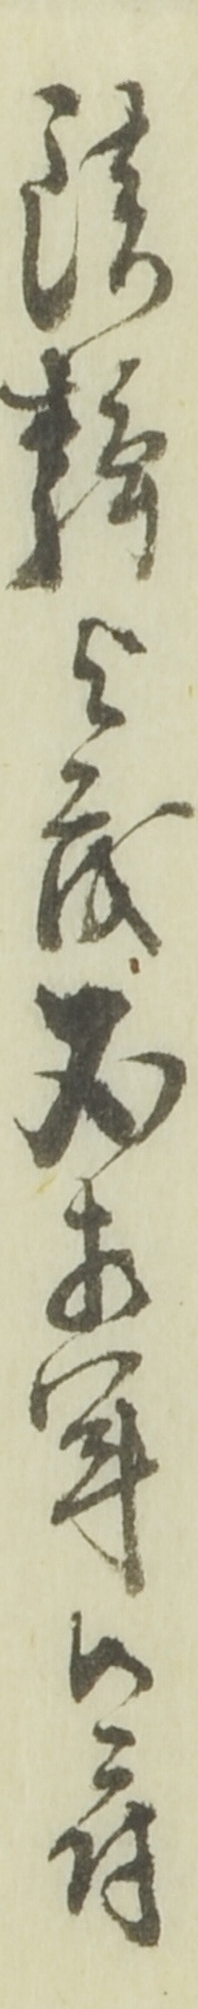鎮静と茂不相聞候ニ付
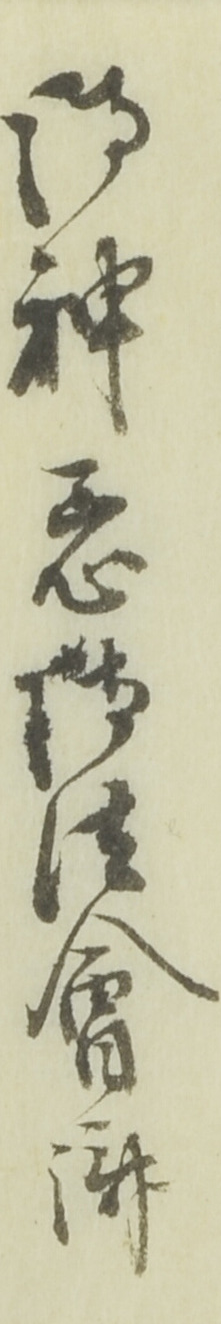御神忌御法会済
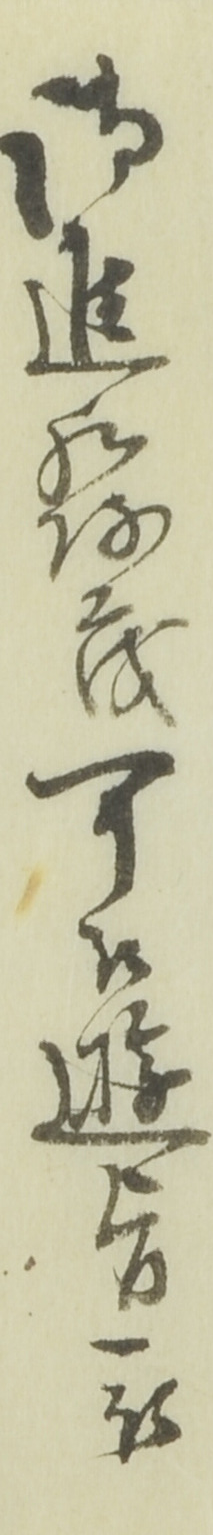御進発茂可被遊旨被
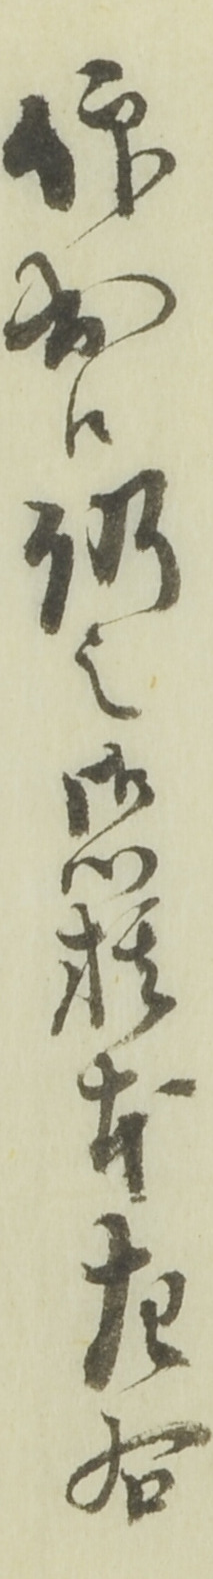仰出候仍之御旗本左右
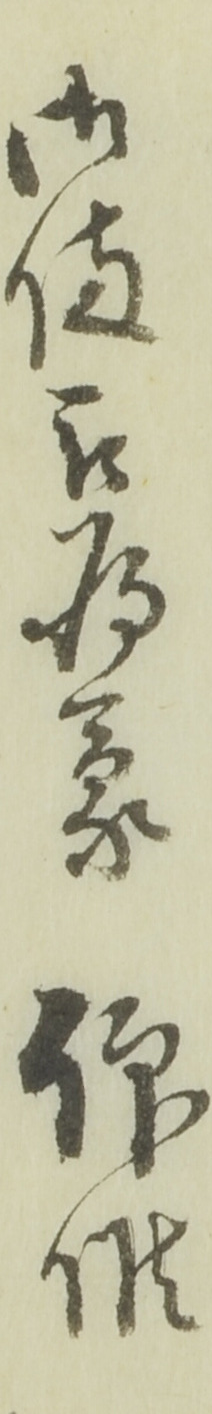御備被為蒙仰候
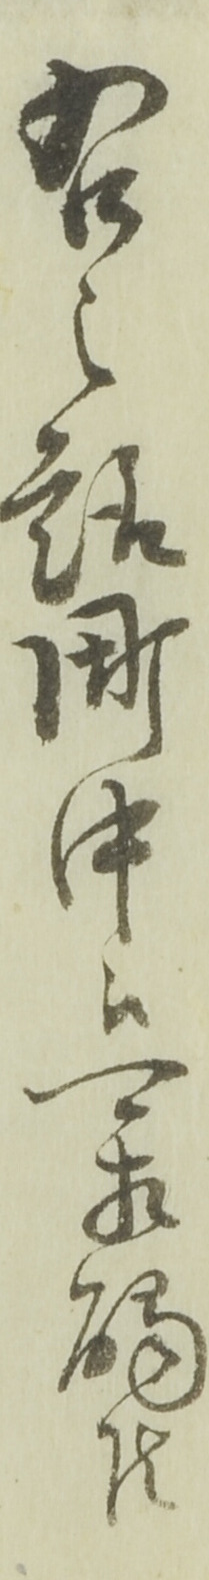右之趣町中江可相触候
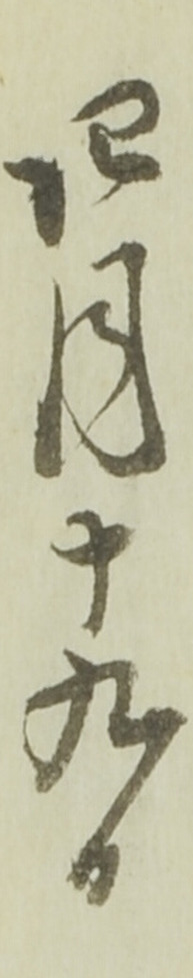四月十九日
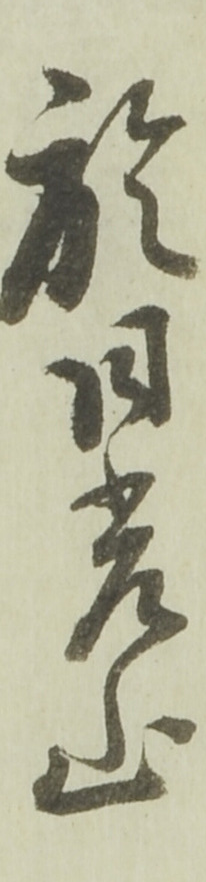於日光山
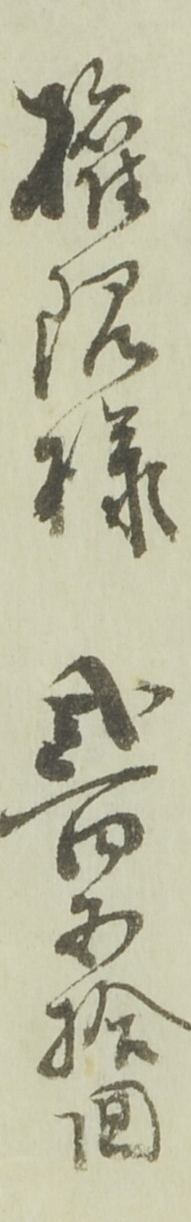権現様弐百五拾回
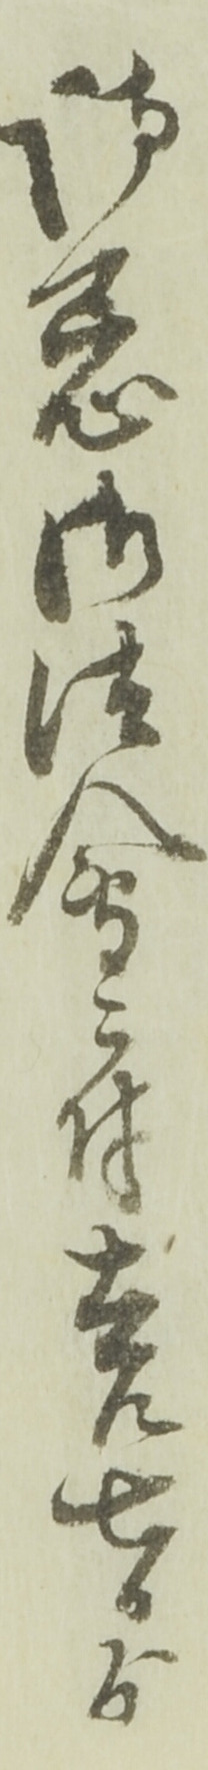御忌御法会ニ付去ル七日ゟ
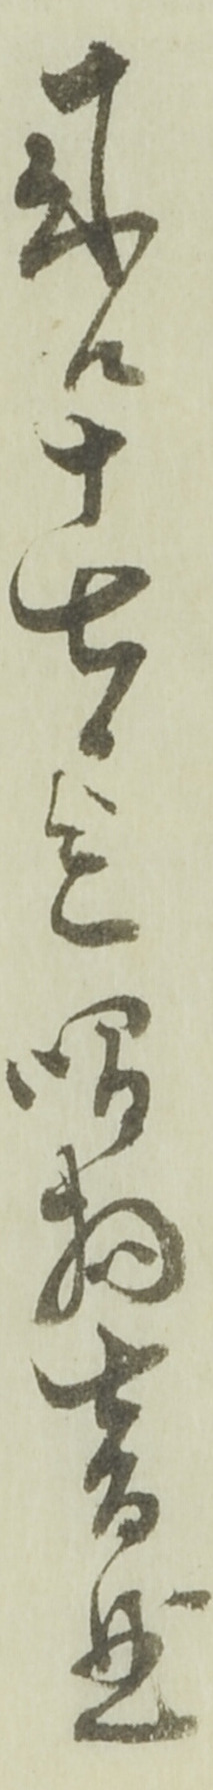来ル十七日迄鳴物音曲
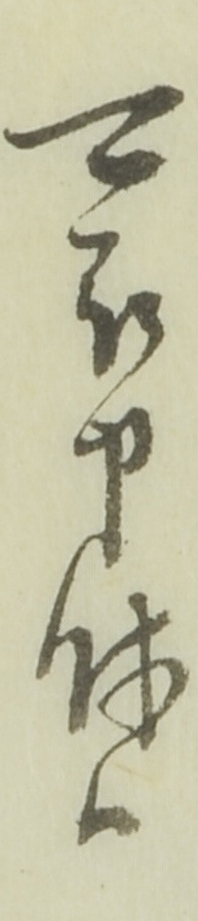可被申付候
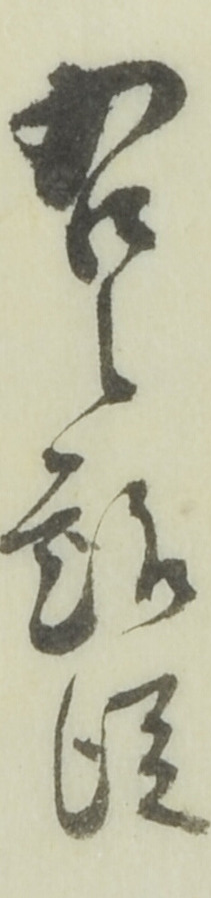右之趣従

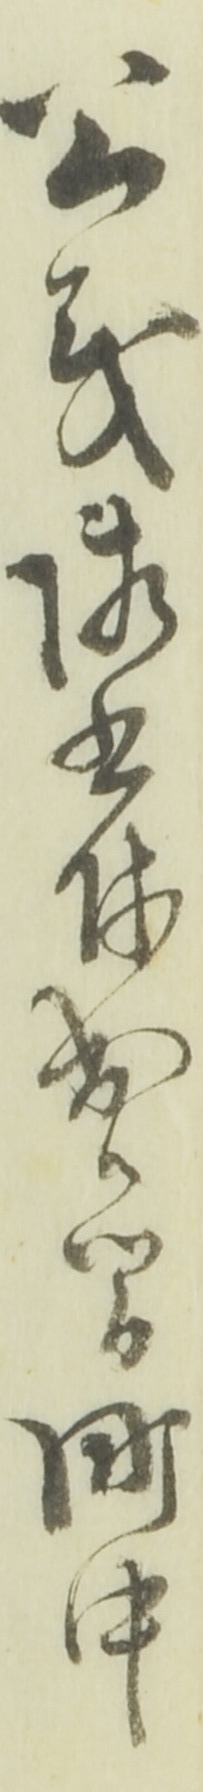公義御書付出候間町中
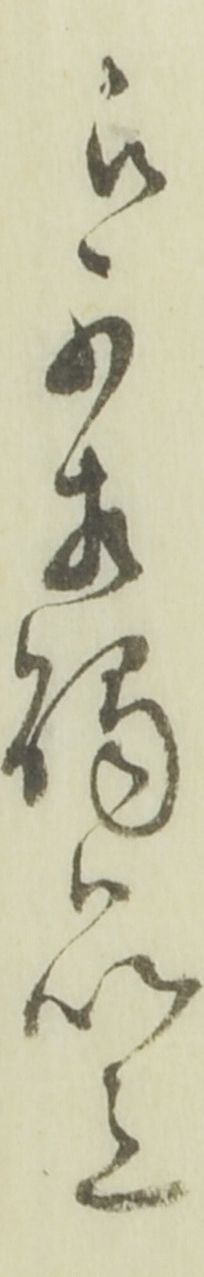江可相触候以上
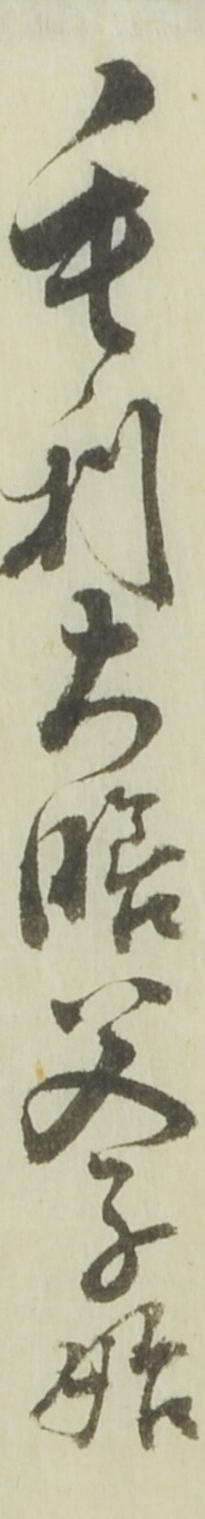毛利大膳父子始
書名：御触書御書附控帳
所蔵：伊那市立高遠町図書館・合同会社AMANE
